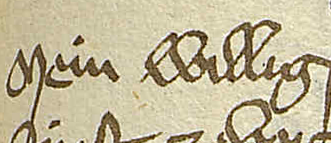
Mein willig*
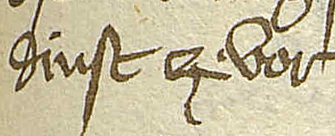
dinſt cʒevor
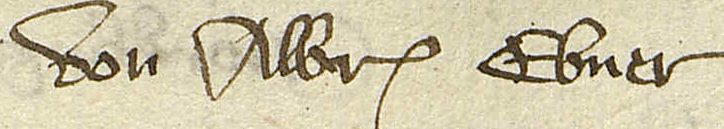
von Albr* Ebner
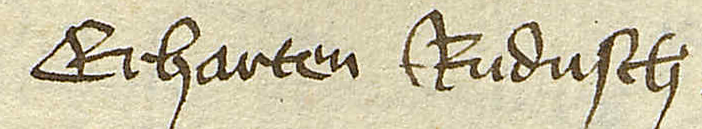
Erharten Ruduſch /
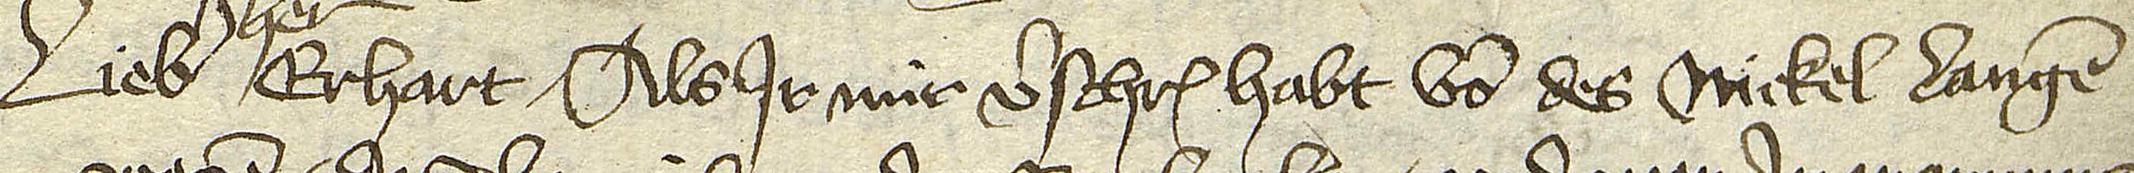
Lieb* Erhart / Als Ir mir v*ſchr* habt vo* des Nickel lange*
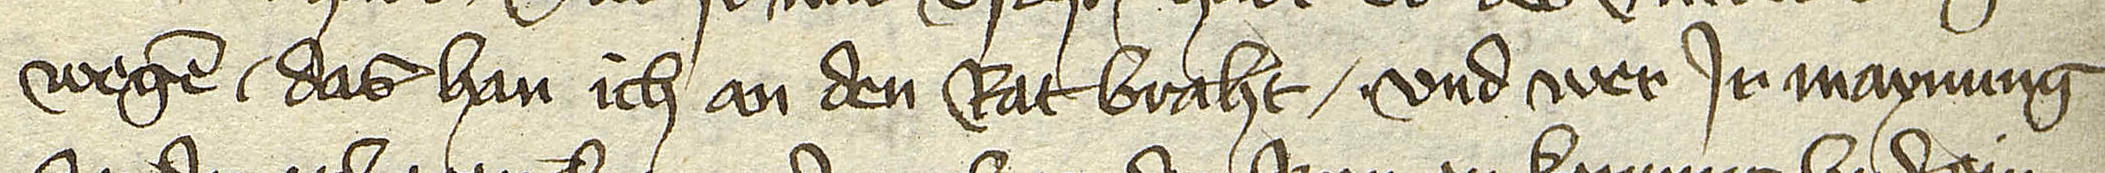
wege* / das han ich an den Rat braht / . vnd wer Ir maynung
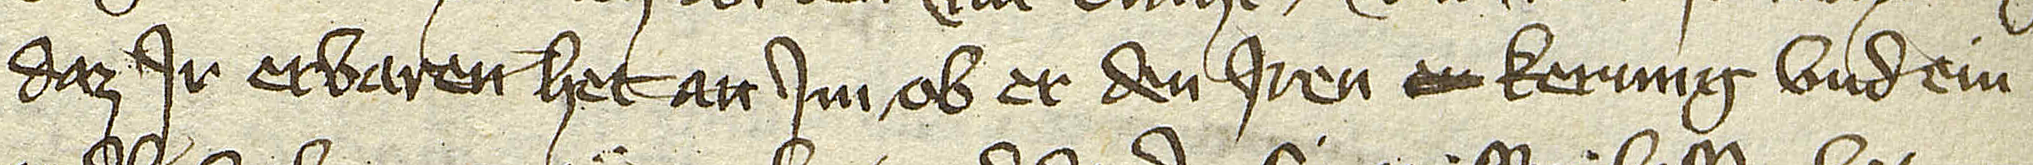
daʒ Ir ervaren het an Im / ob er den Iren ei kerung vnd ein
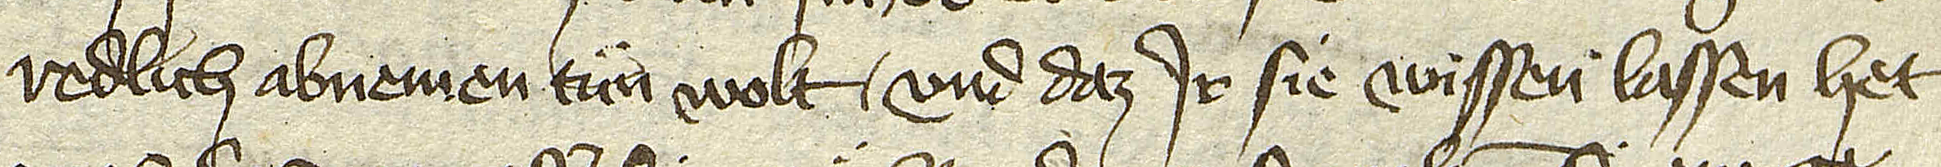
redlich abnemen tün wolt / vnd daʒ Ir ſie wiſſen laſſen het
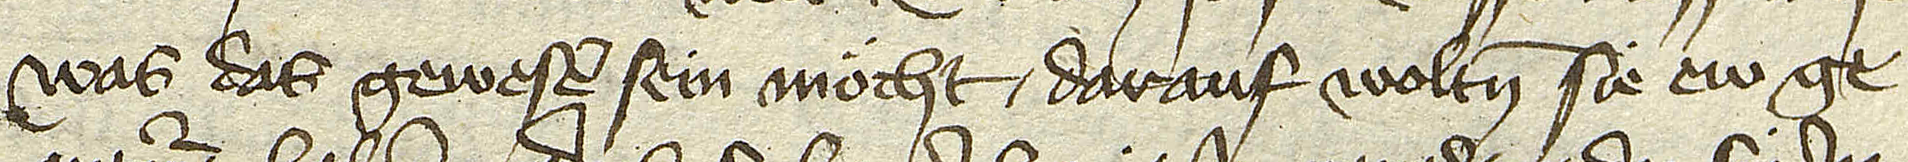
was das geweſe* ſein möcht / darauf woltn* ſie ew ge
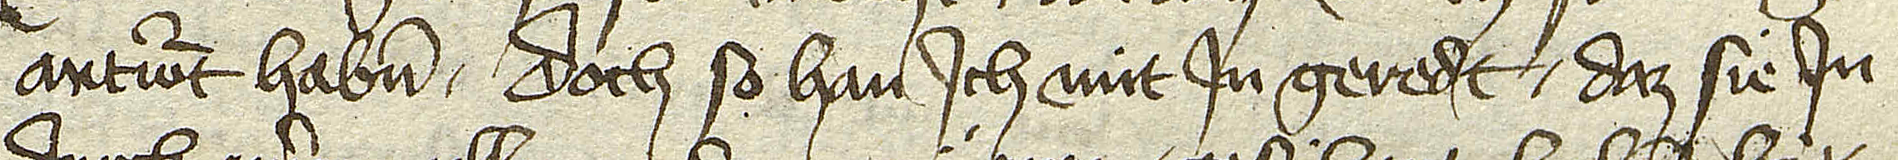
antwt* habn* / Doch ſo han Ich mit In geredt / daʒ ſie In
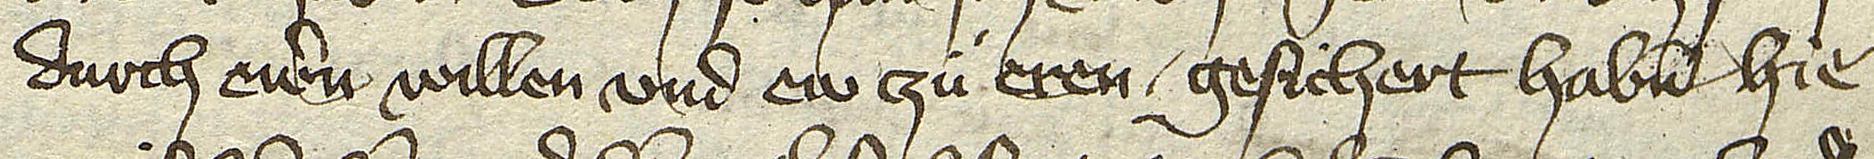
durch ew*n willen vnd ew cʒü eren / geſichert habn* hie
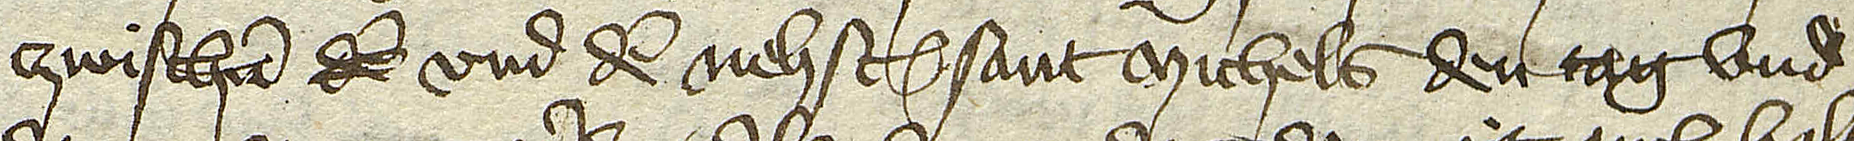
cʒwiſchn* de* vnd d* nehſt* ſant Michels den tag vnd
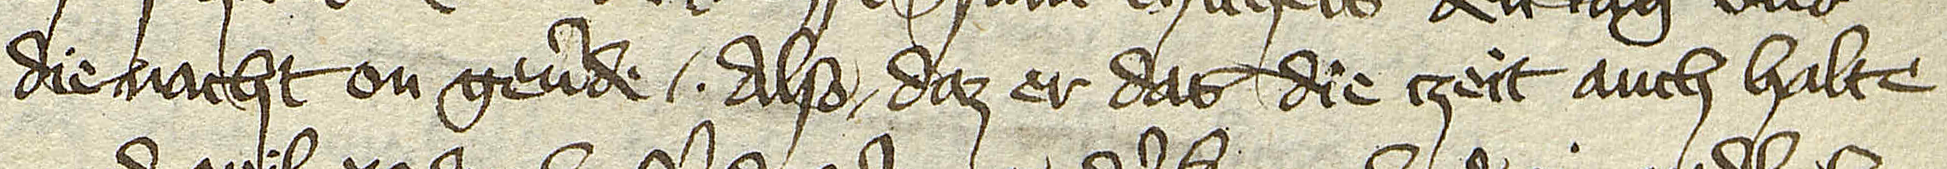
die nacht on geu*de / . Alſo / daʒ er das die cʒeit auch halte
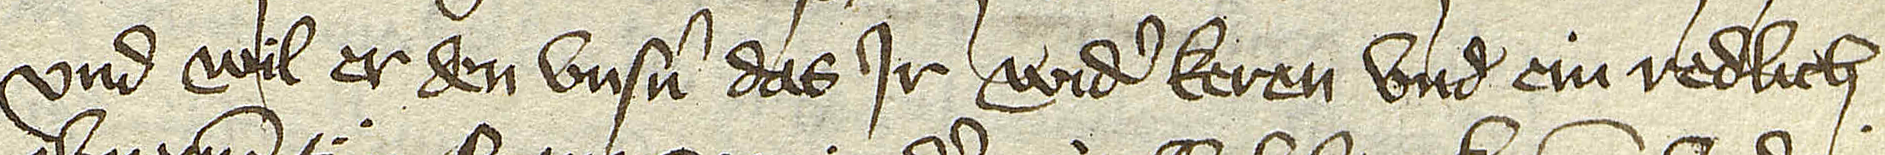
vnd wil er den vnſn* das Ir wid* keren vnd ein redlich
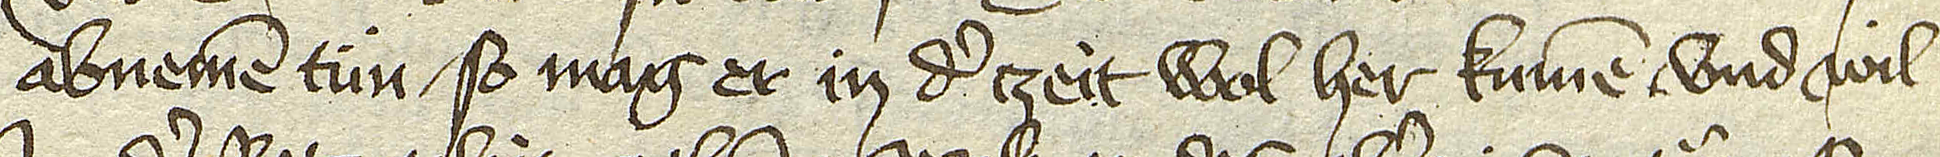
abneme* tün / ſo mag er in d* cʒeit wol her kume* / vnd wil
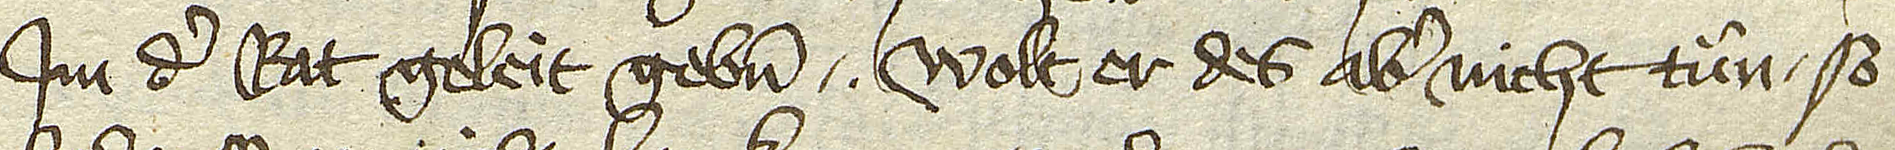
Im d* Rat geleit gebn* / . Wolt er des ab* nicht tün / ſo
